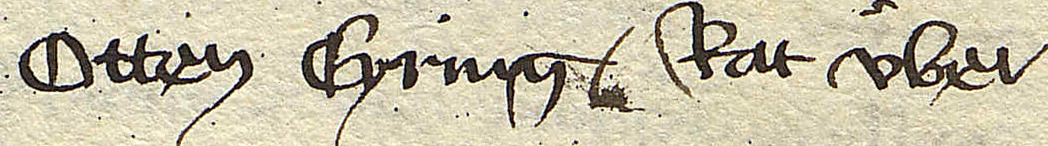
Otten Eyring / Rat v̈ber
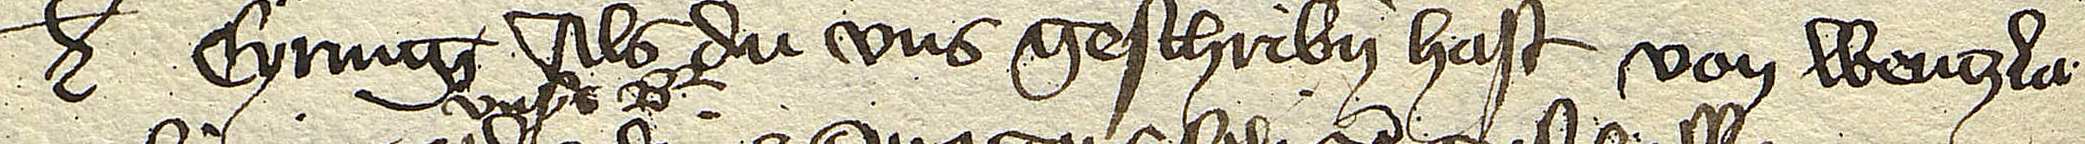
L* Eyring / Als du vns geſchribn* haſt von wencʒla
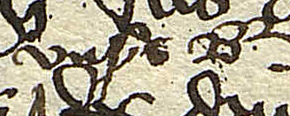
vnſ*s B*
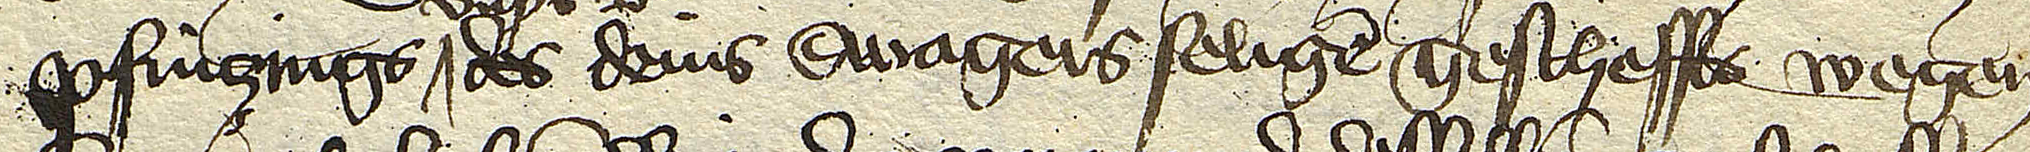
Pfincʒings des deins Swagers ſelige* geſcheffts wegen
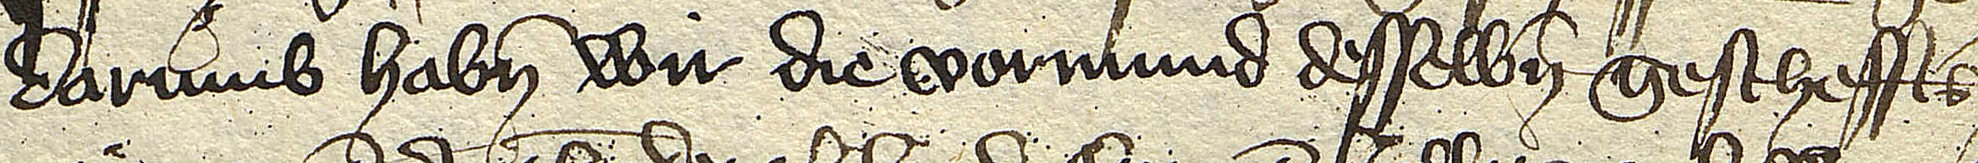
darümb habn* wir die vormund deſſelbn* geſcheffts
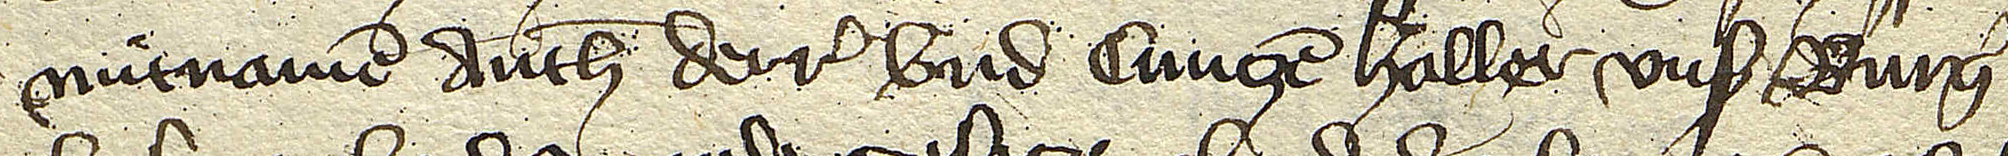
mitname* Anth* derr* vnd Cuncʒe* haller vnſ* Burg*
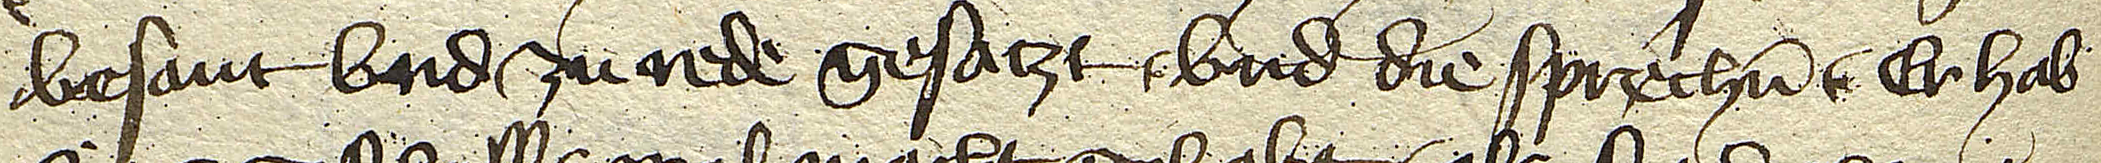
beſant vnd cʒu rede geſacʒt / vnd die ſprechn* / Er hab
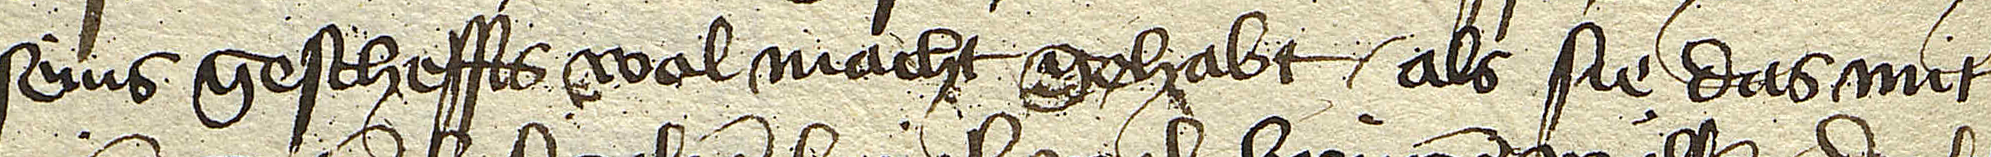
ſeins geſcheffts wol macht gehabt / als ſie das mit
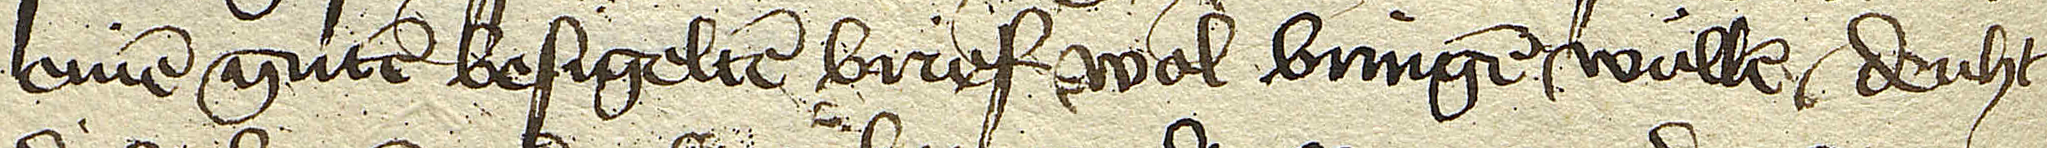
eine* gute* beſigelte* brief wol bringe* wölle* / deuht
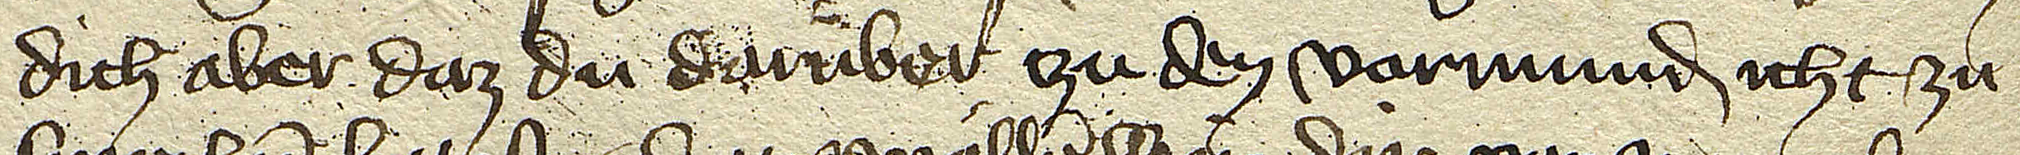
dich aber daʒ du darüber cʒu den vormund* icht cʒu
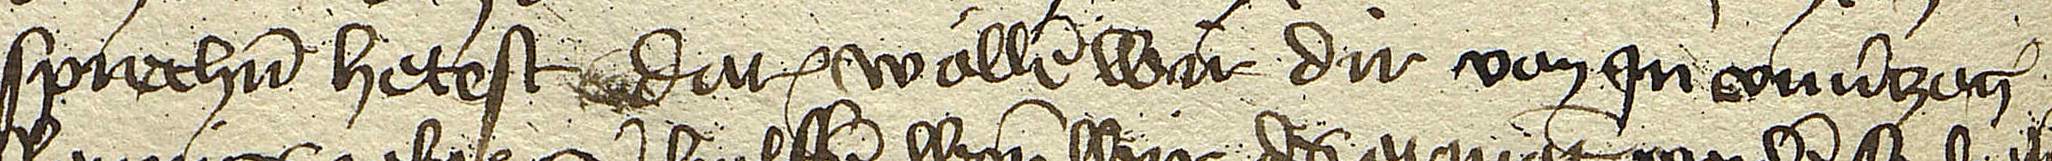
ſprechn* heteſt / dar* wölle* wir dir von In vnu*cʒog*
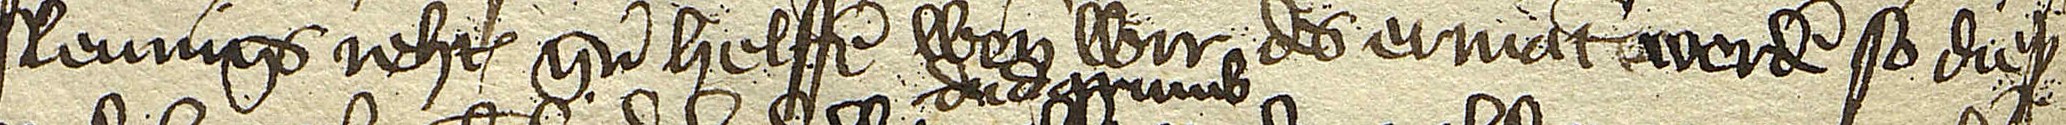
ſlewnigs reht* gn* helffe* wen* wir des ermat* werde* ſo dieſ*
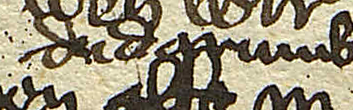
du darumb
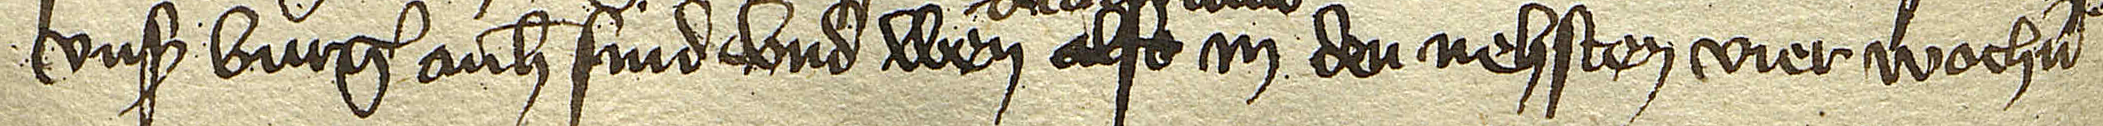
vnſ* burg* anh* ſind / vnd wen* alſo in den nehſten vier wochn*
